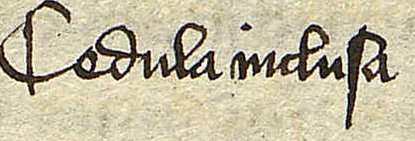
Cedula incluſa
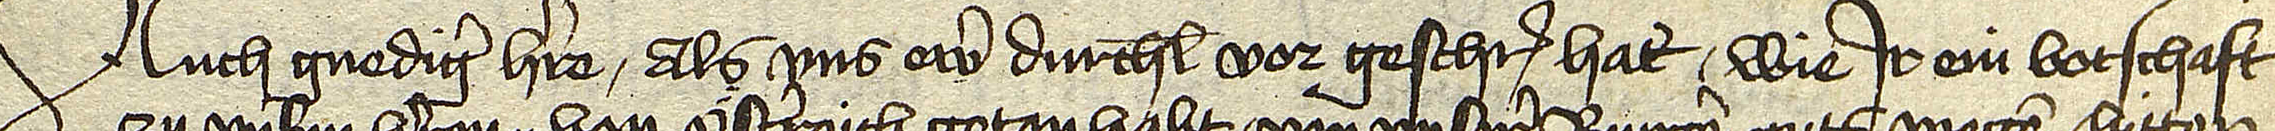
Auch gnedig* h*re / Als vns ew* durchl* vor geſchr* hat / wie Ir ein botſchaft
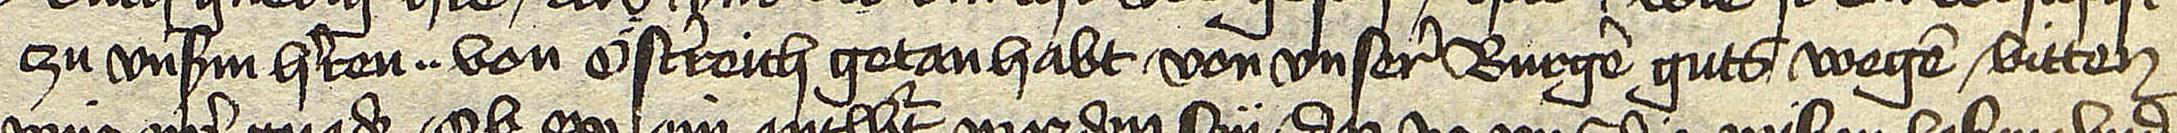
cʒu vnſ*m h*ren ~ von Öſt*reich getan habt / von vnſer* Burge* guts wege* / bitten
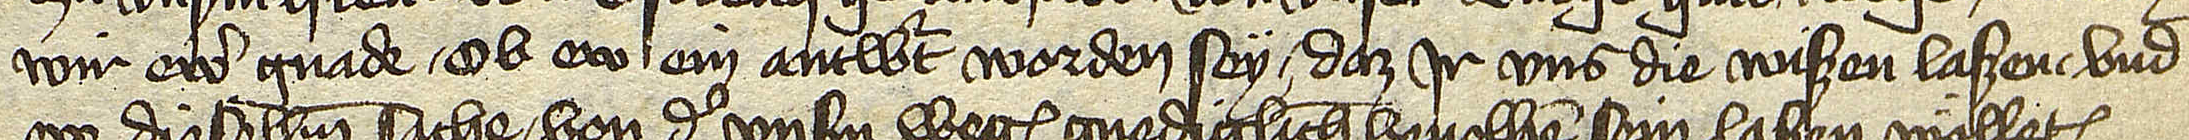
wir ew* gnade / Ob ew ein antw*t worden ſey / daʒ Ir vns die wiſʒen laſʒen / vnd
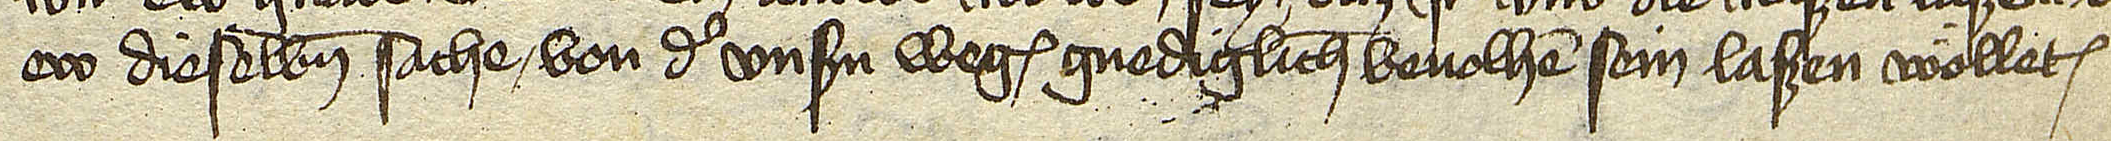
ew dieſelbn* ſache von d* vnſ*n weg* gnediglich* beuolhe* ſein laſʒen wöllet
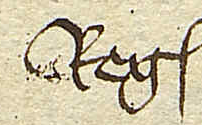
Reg*
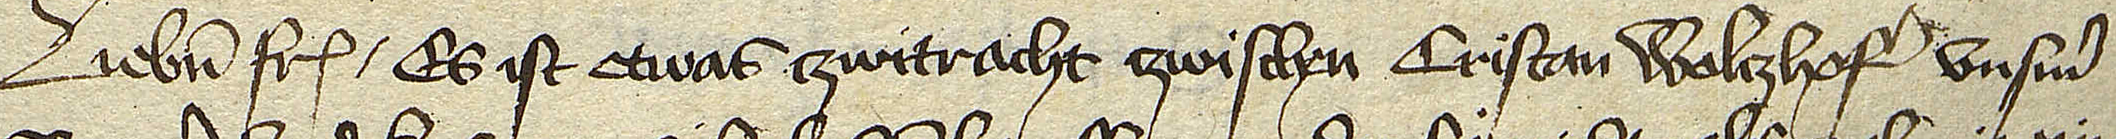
Liebn* fr* / Es iſt etwas cʒwitracht cʒwiſchen Criſtan Wolcʒhof* vnſm*
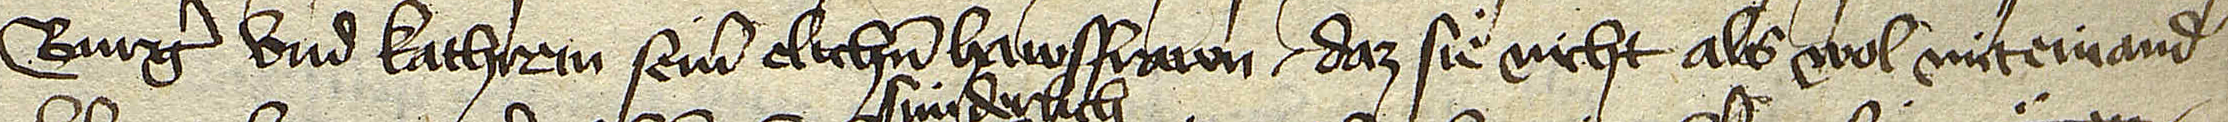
Burg* vnd kathrein ſein* elichn* hawſfrawn / daʒ ſie nicht als wol miteinand*
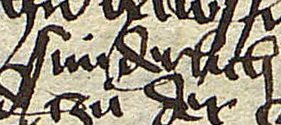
ſünderlich
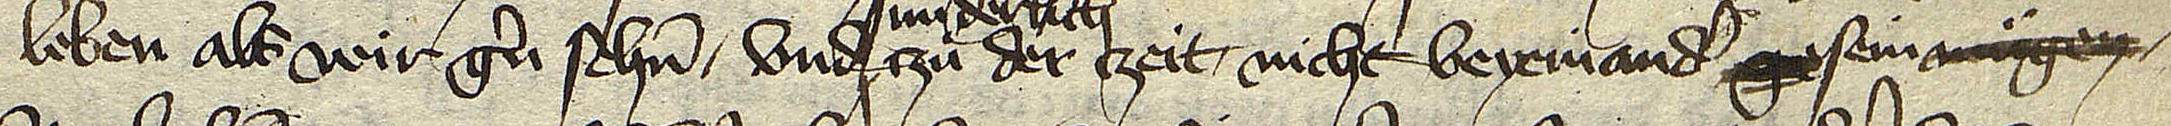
leben als wir g*n ſehn* / vnd cʒü der cʒeit / nicht beyeinand* geſein mügen /
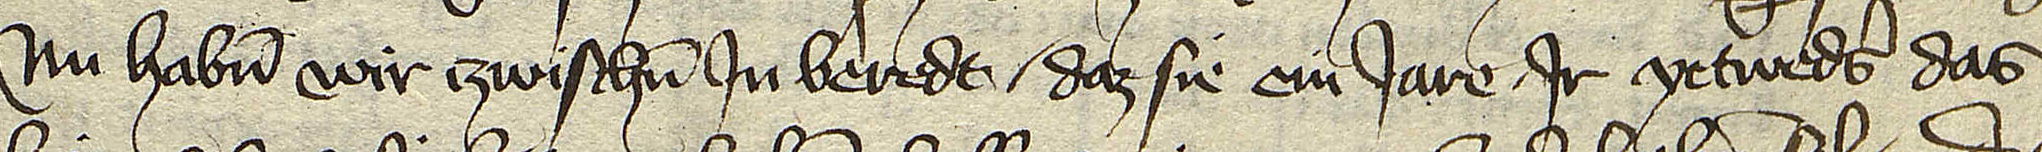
Nu habn* wir cʒwiſchn* In beredt / daʒ ſie ein Iare / Ir yetweds* das
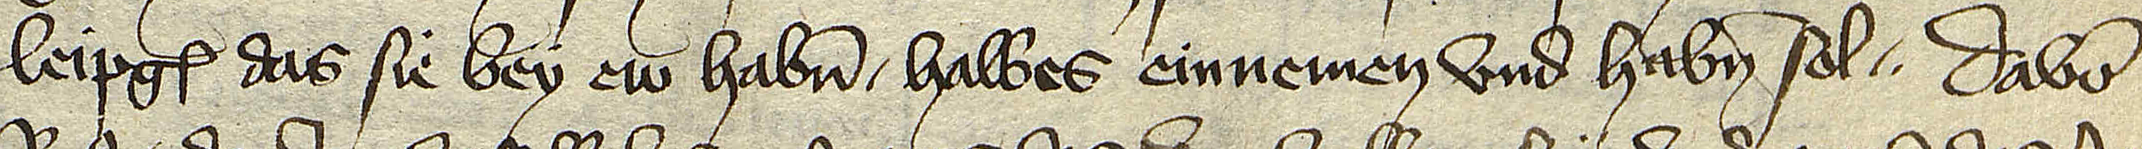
leipg* das ſie bey ew habn* / halbes einnemen vnd habn* ſol / . Davo*
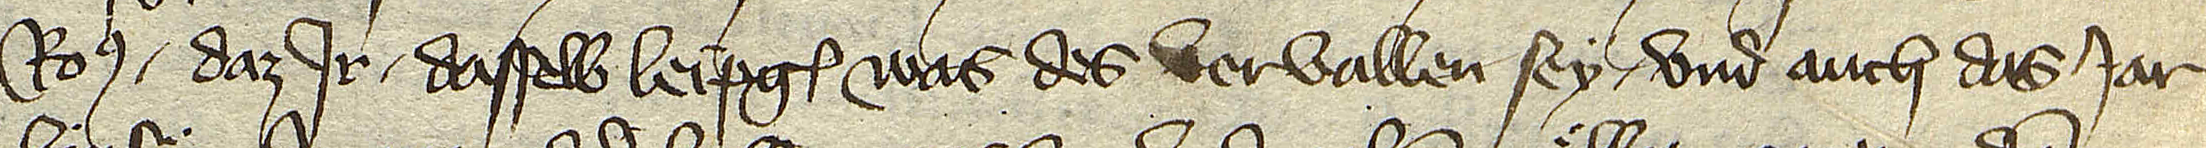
Ro* /daʒ Ir / daſſelb leipg* was des vervallen ſey / vnd auch das Iar
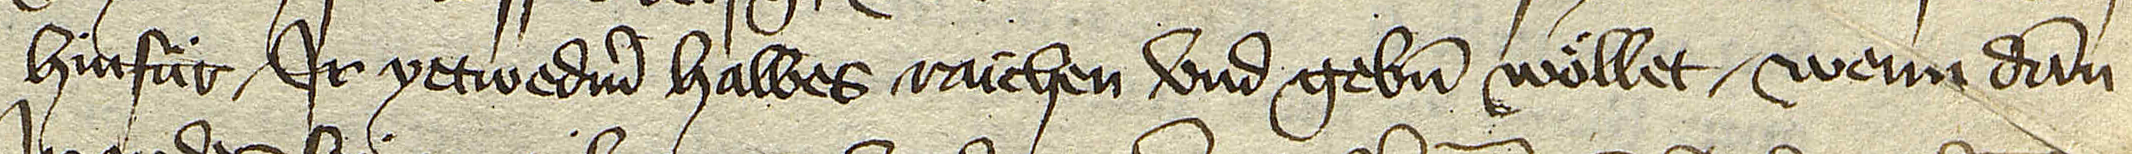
hinfür / Ir yetwedm* halbes raichen vnd gebn* wöllet / wenn da*n
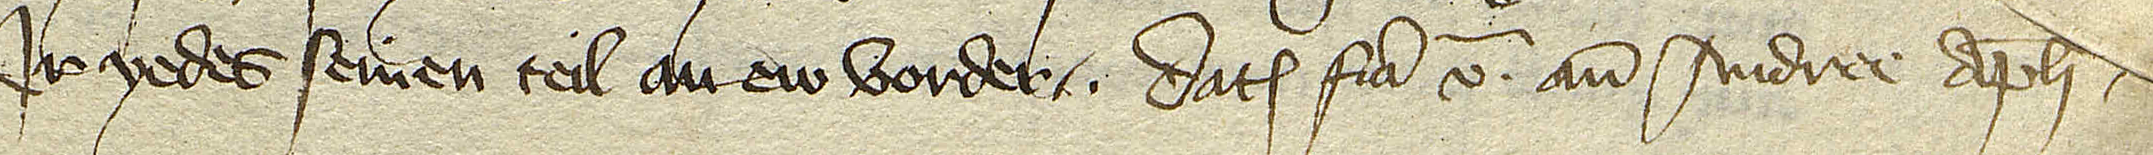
Ir yedes ſeinen teil an ew vorder / . Dat* fia* . v* . an* Andree Apli* /
